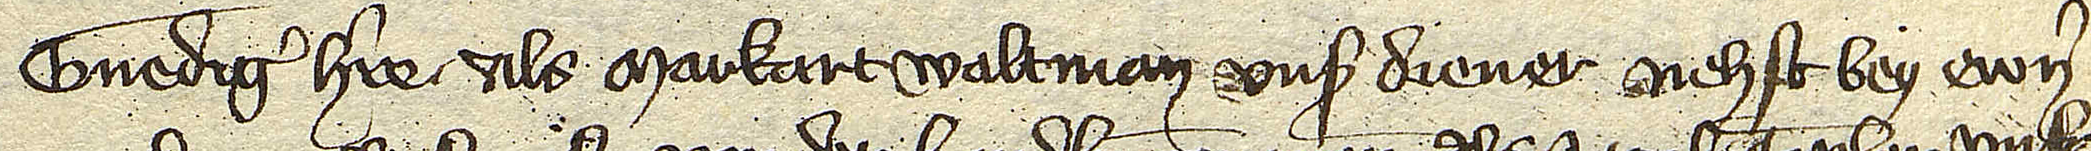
Gnedig* h*re / Als Markart waltman vnſ* diener nehſt bey ewn*
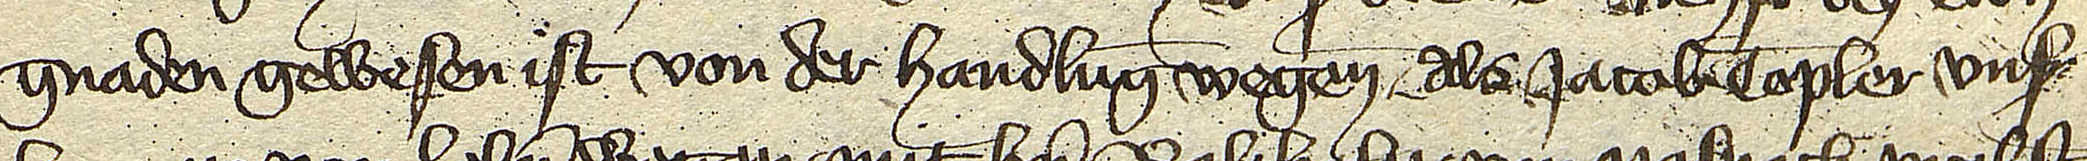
gnaden geweſen iſt von der handlug* wegen / als Iacob Topler vnſ*
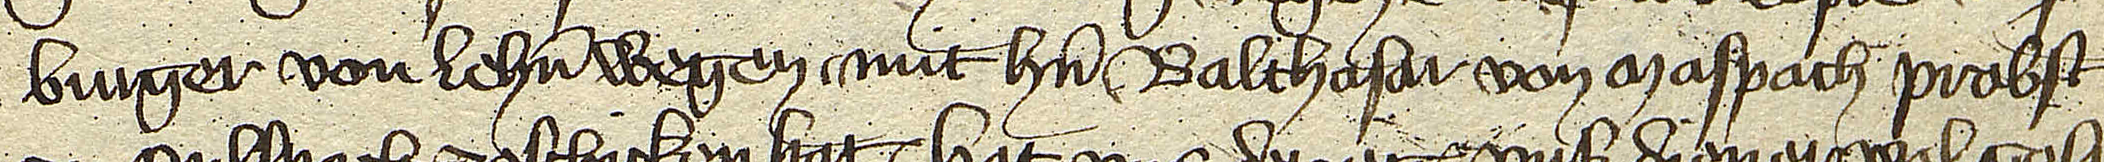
burger von lehn* wegen / mit hn* Balthaſar von Maſpach Probſt
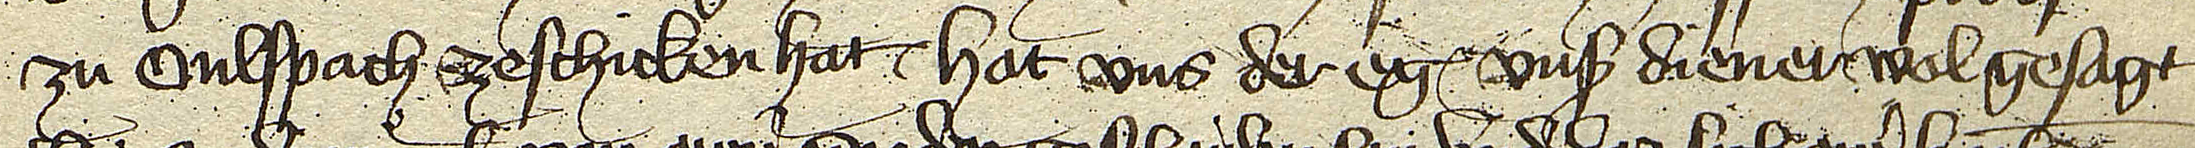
cʒu Onlſpach cʒeſchicken hat / hat vns der eg* vnſ* diener wol geſagt
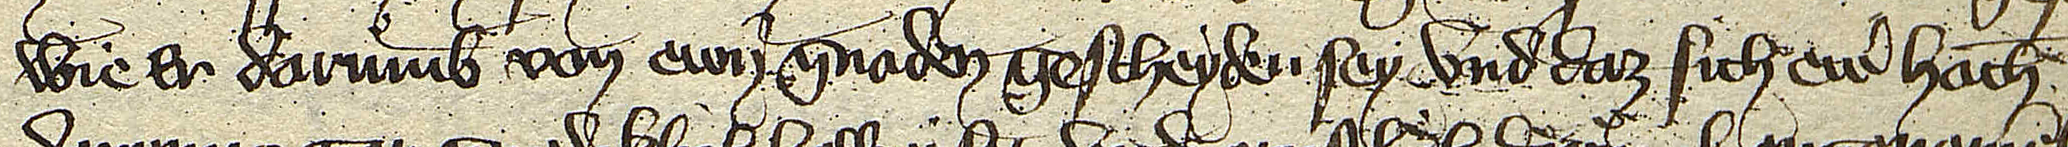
wie Er darümb von ewn* gnaden geſcheyden ſey vnd daʒ ſich ew* hoch*
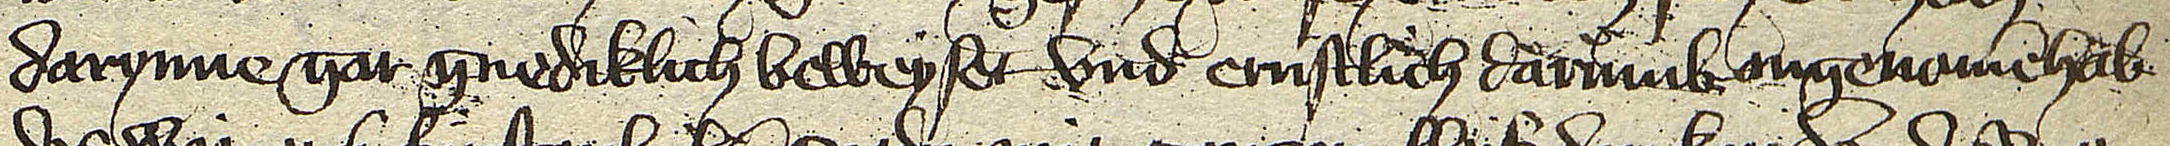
darynne gar gnediklich beweyſet vnd ernſtlich darümb angenome* hab
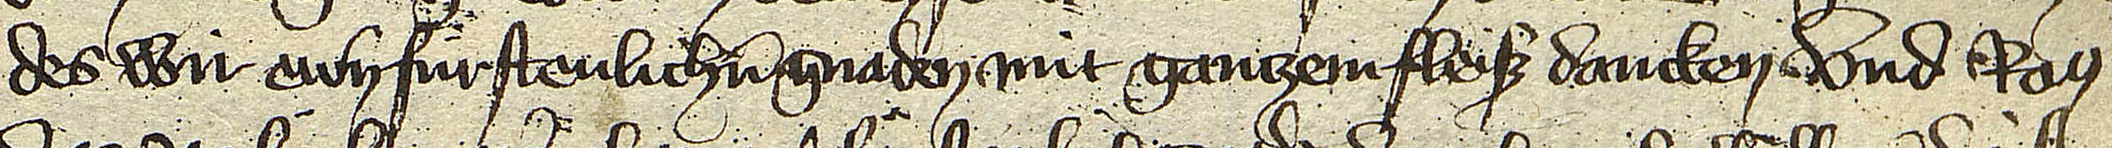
des wir ewn* fürſtenlichn* ganden mit gancʒem fleiſʒ dancken / Vnd Ro*
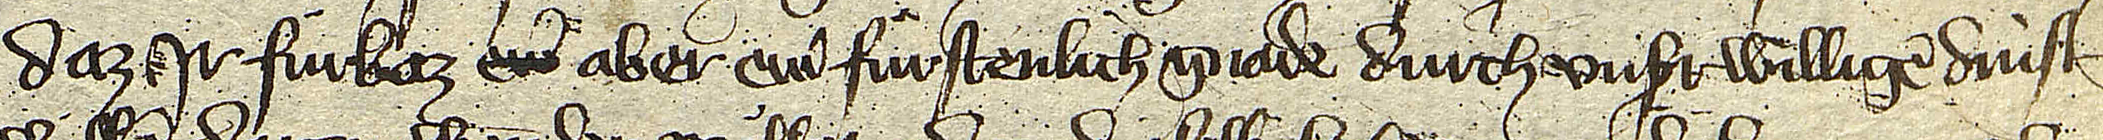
daʒ Ir fürbaʒ ew* aber ew* fürſtenlich gnade durch vnſ*r willige* dinſt
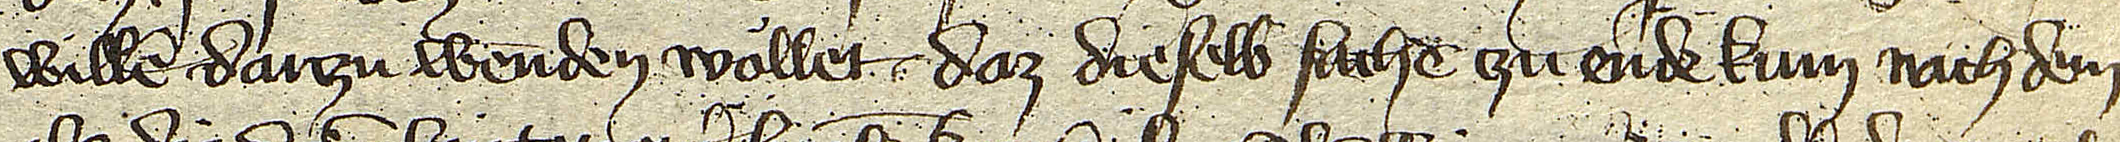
wille* darcʒu wenden wöllet / daʒ dieſelb ſache cʒu ende kum nach dem
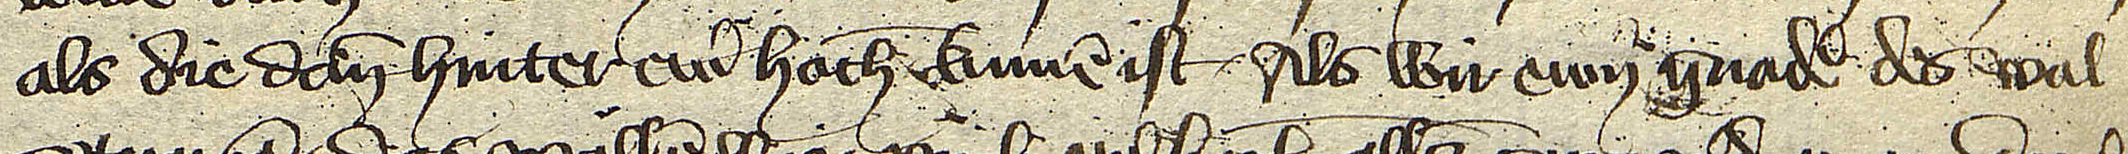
als die dan* hinter ew* hoch* kume* iſt / Als wir ewn* gnade* des wol
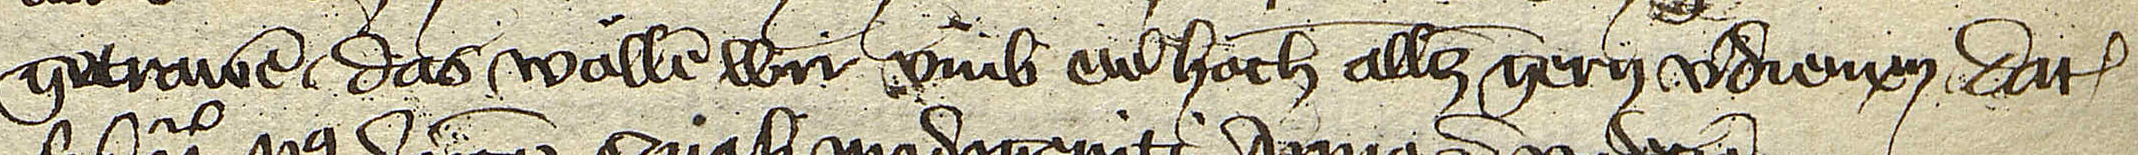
getrawe* / das wölle* wir v̈mb ew* hoch* allcʒ* gern v*dinen / Dat*
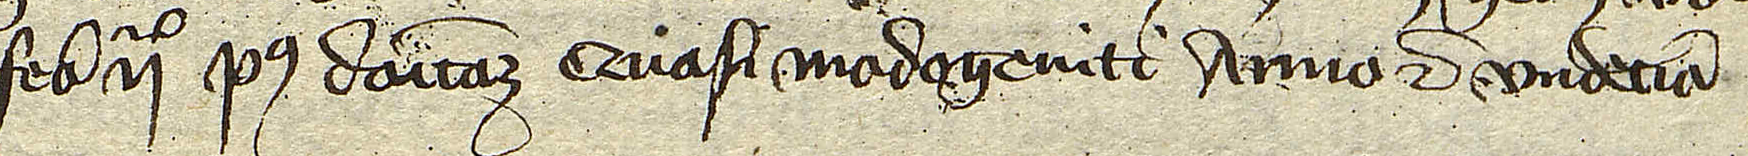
fea*ii* p* doica* Quaſi modogeniti Anno ec* vndecio*
